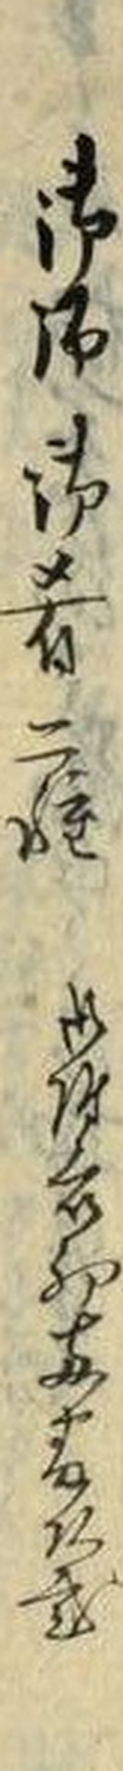御酒御肴二種御附衆初両番頂戴

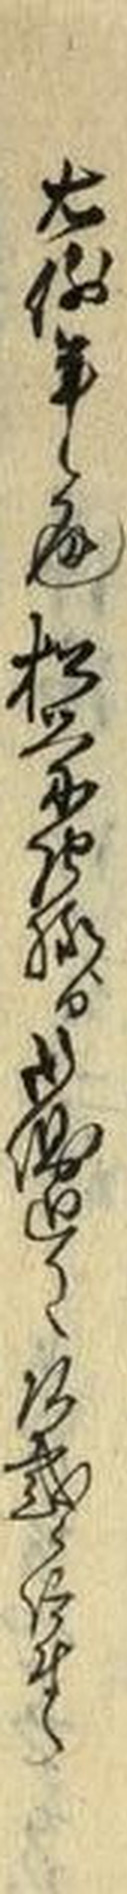右例年之通松栄院様ゟ御側廻りへ頂戴被仰付候
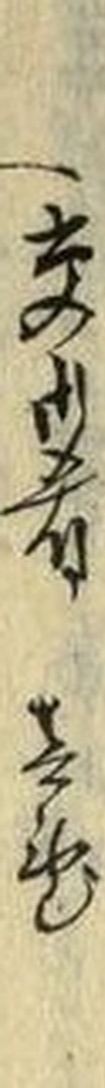交御肴壱台
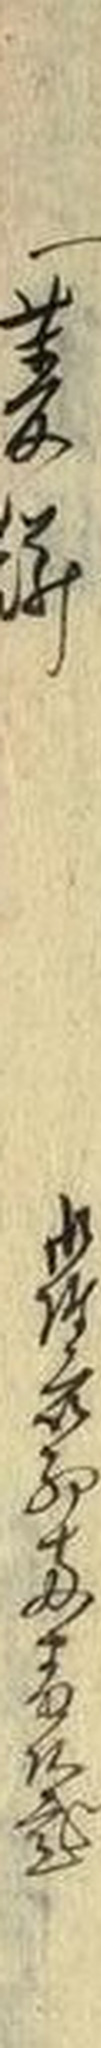菱餅御附衆初両番頂戴
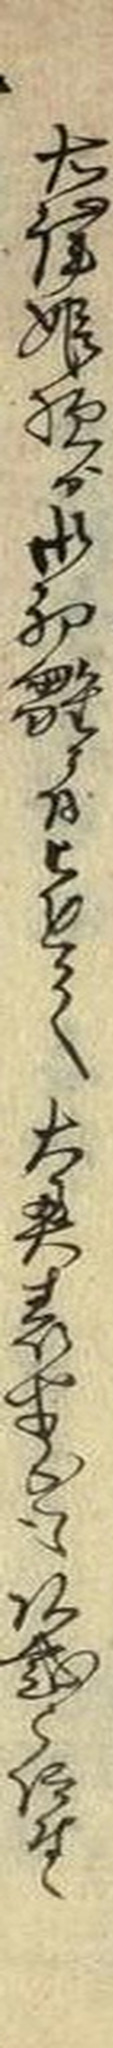右謹姫様ゟ御初雛ニ付被進之大奥表半分ツヽ頂戴被仰付候
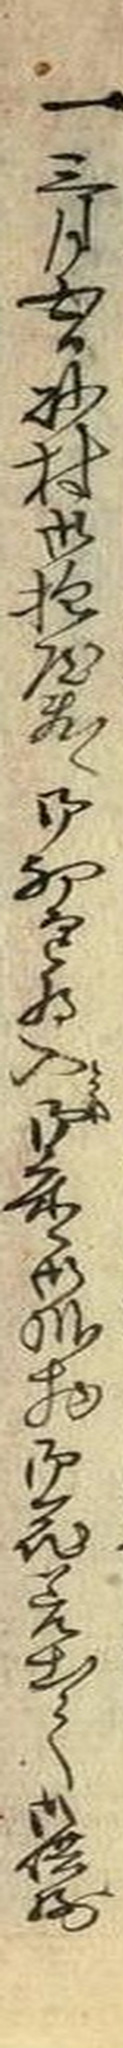一三月五日砂村御抱屋敷へ御初而被為入ニ付御床御掛物御花差出之御供揃
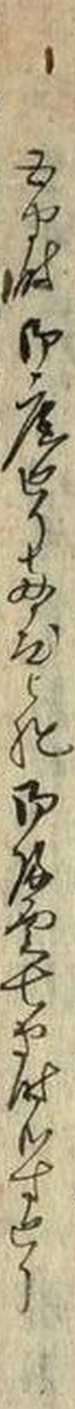五半時御庭廻り両度被遊御帰殿七半時弐寸廻り
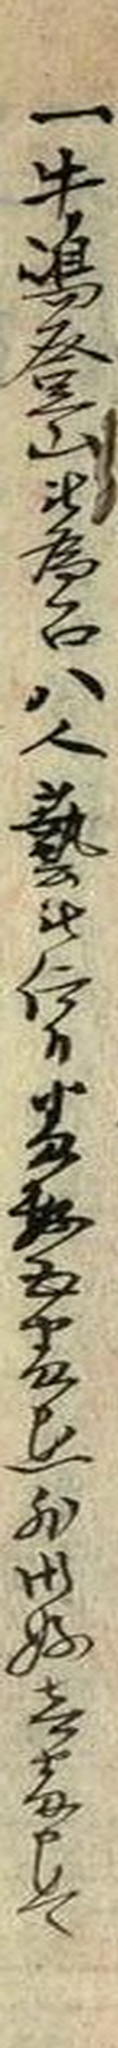一牛嶋登山被為召八人芸被仰付番数五番申上外御好壱番申上候
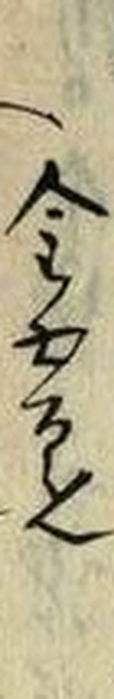金五百疋
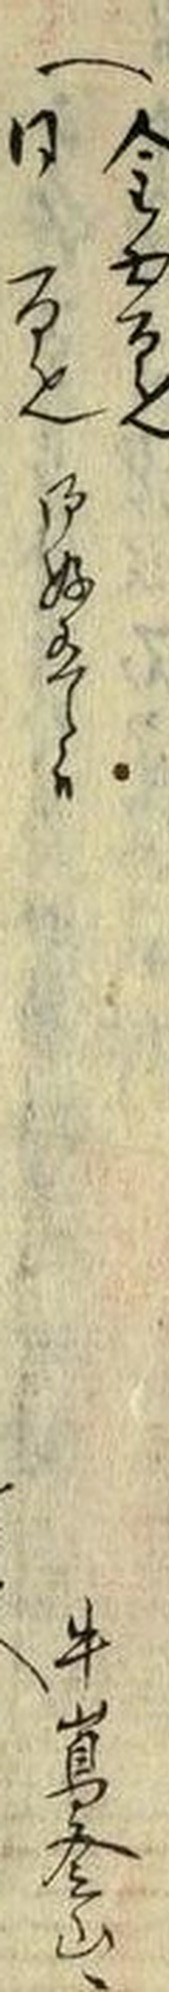同百疋御好有之ニ付牛嶋登山へ
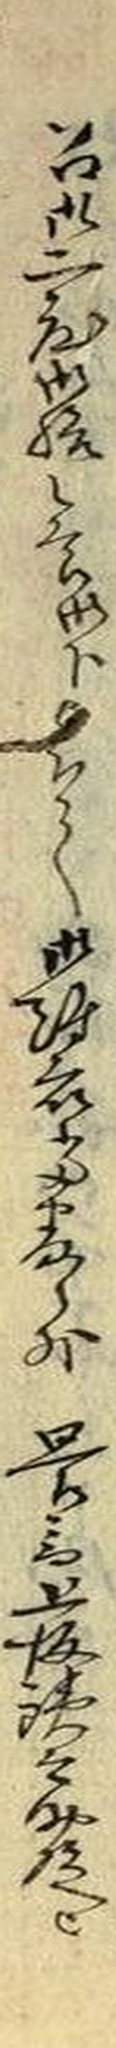召御二度御膳之節御下被下之御附衆当番之外思召ニ而上坂鉄之助殿被
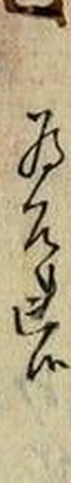為召連候
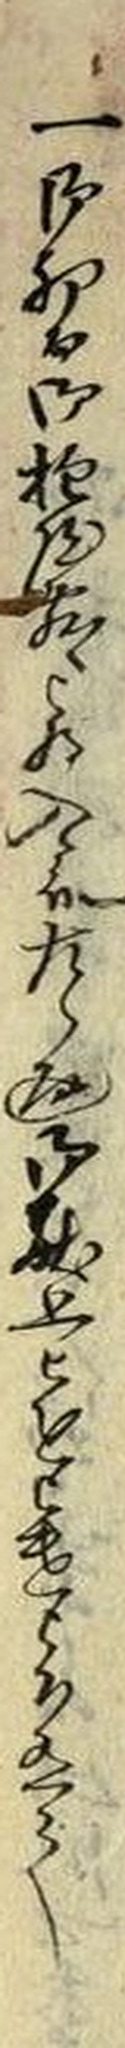一御初而御抱屋敷へ被為入候ニ付左之通御献上被進被遣被下有之
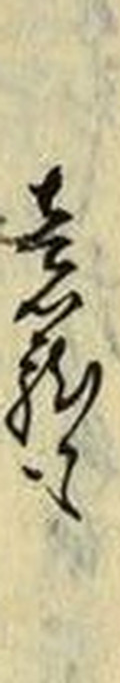蜆壱籠ツヽ
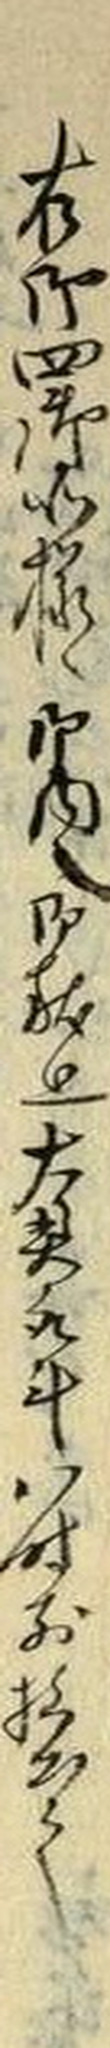右御四御所様へ御内々御献上大奥取斗八時前指出之
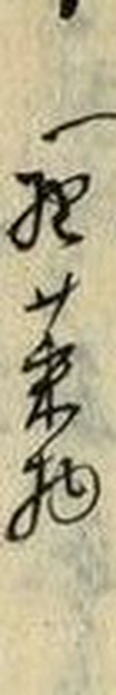野菜物
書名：少傅日録抄（斉善付側向頭取日記、江戸并道中、初入在国、逝去後…
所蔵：福井県文書館 Fukui Prefectural Archives
